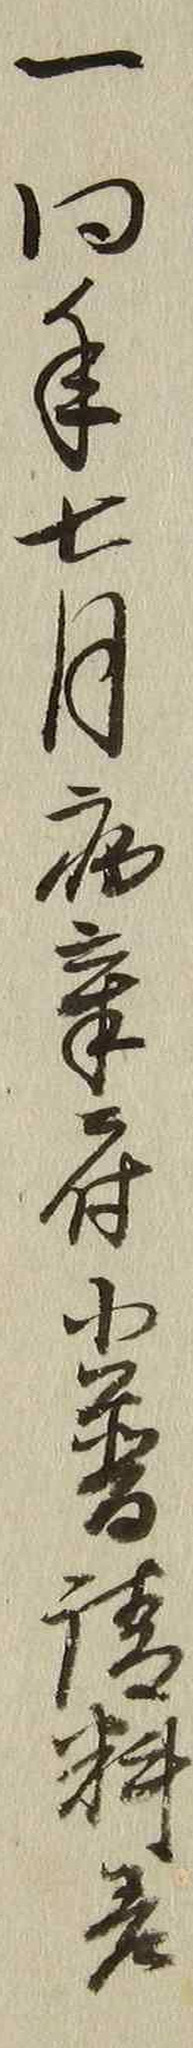一同年七月病気ニ付小普請料差
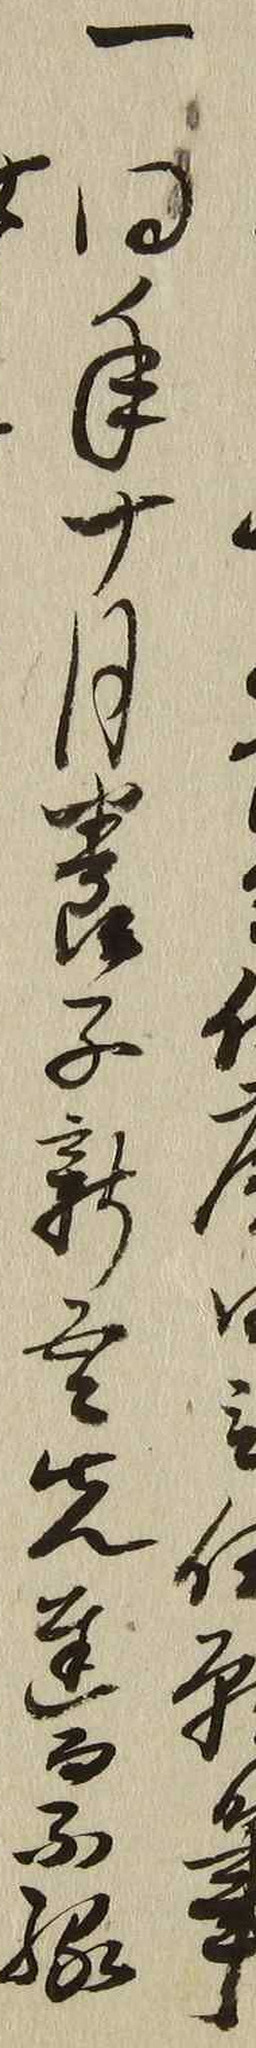一同年十月養子新吾先達而不縁
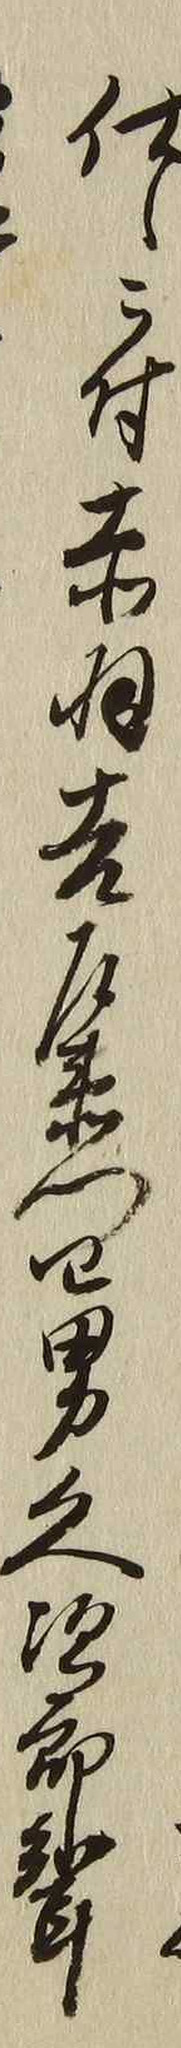仕候ニ付赤羽吉左衛門四男久次郎婿
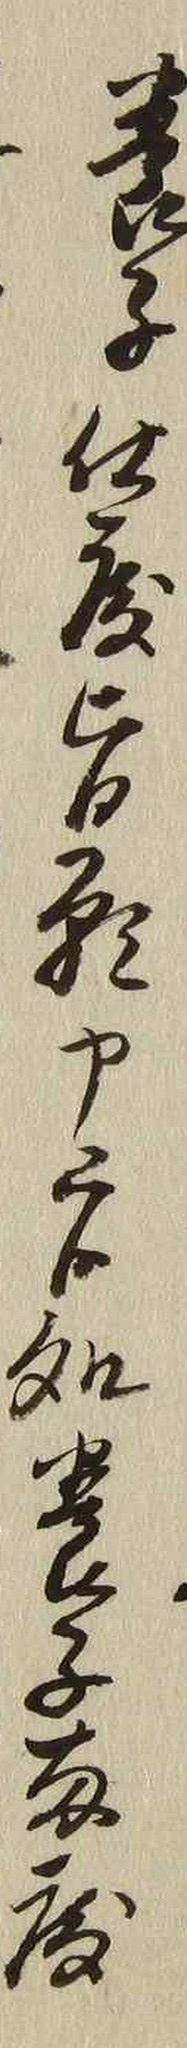養子仕度旨願申上候処養子両度
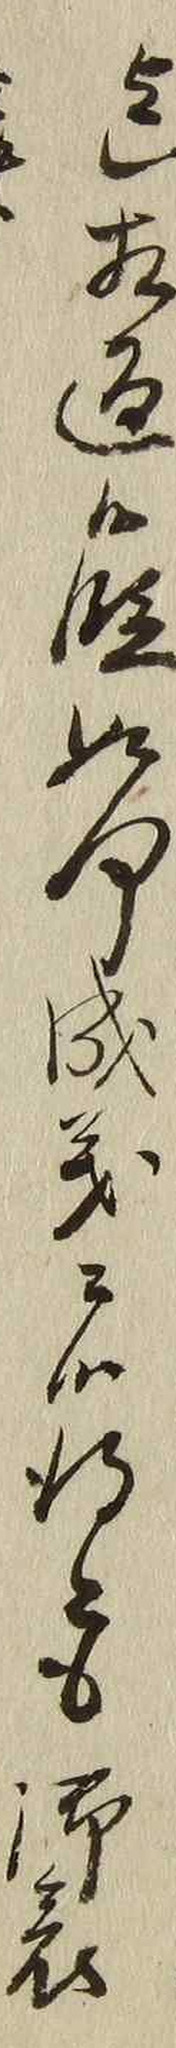迄相返候段如何成義ニ候得とも御哀
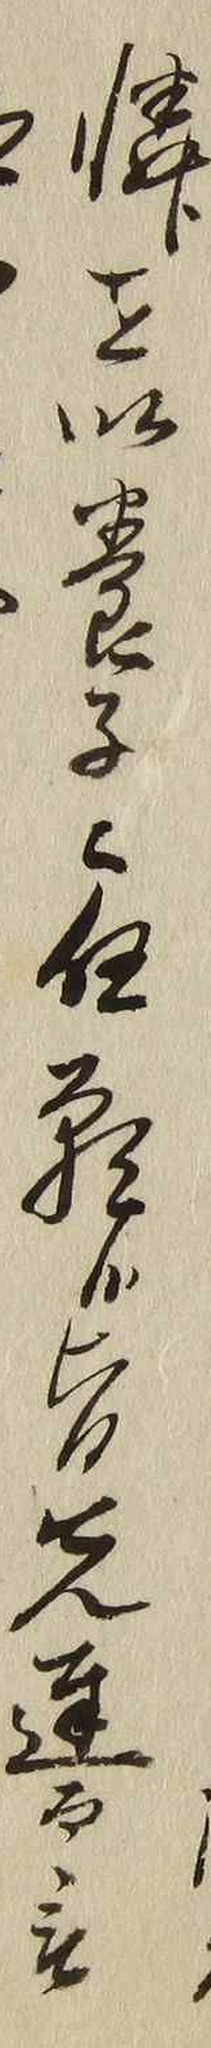憐を以養子被任願候旨先達而被
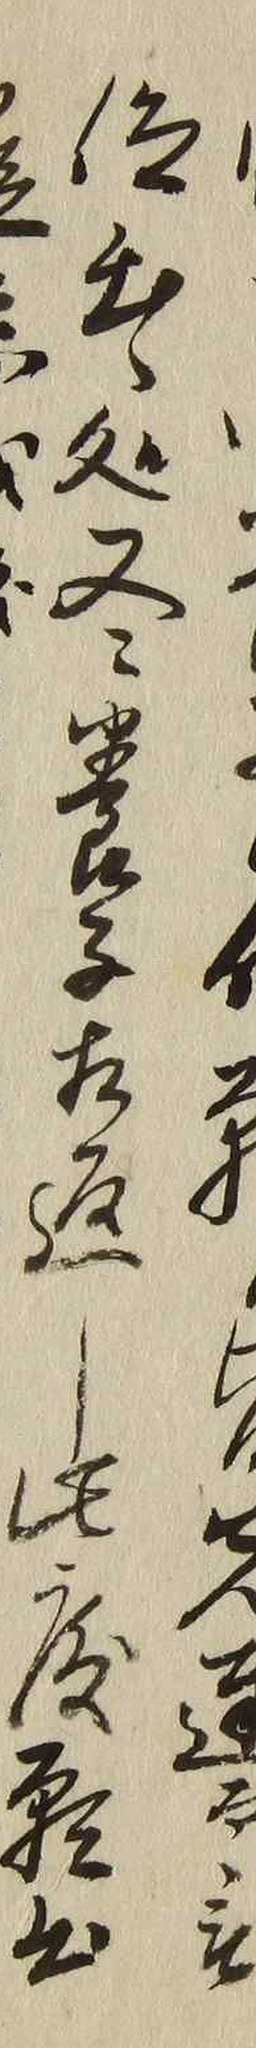仰出候処又々養子相返し此度願出
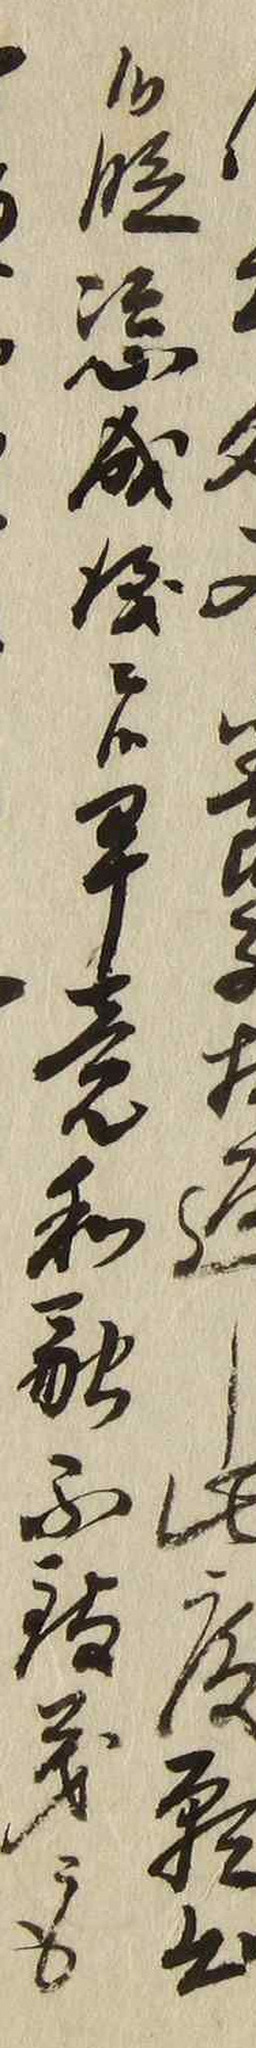候段恣成儀ニ候畢竟和融不致義ニも
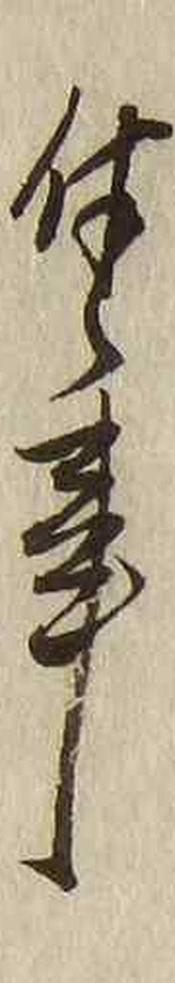付候事
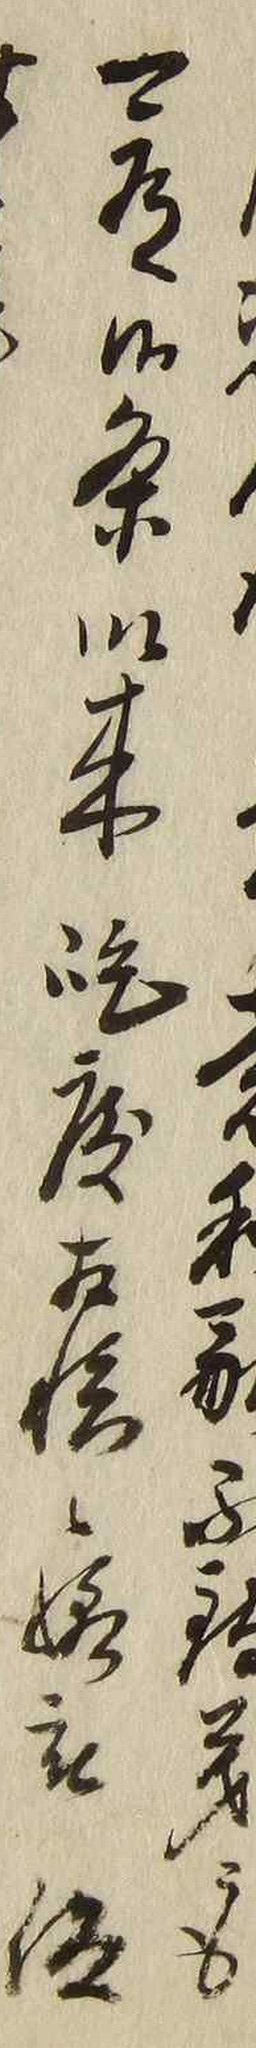可有候条以来吃度相慎候様被仰

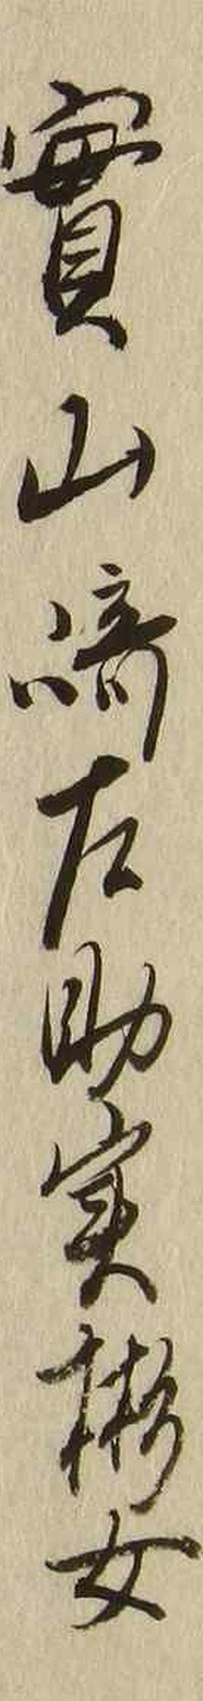実山崎左助実彬女
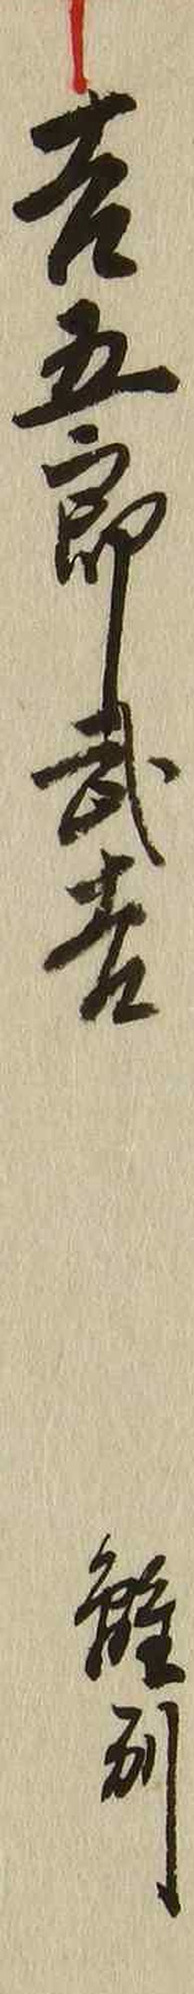吉五郎武吉離別
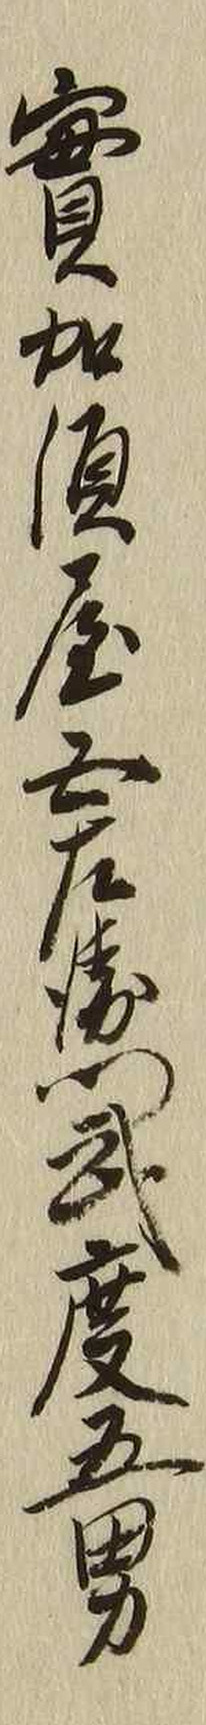実加須屋五左衛門武度五男
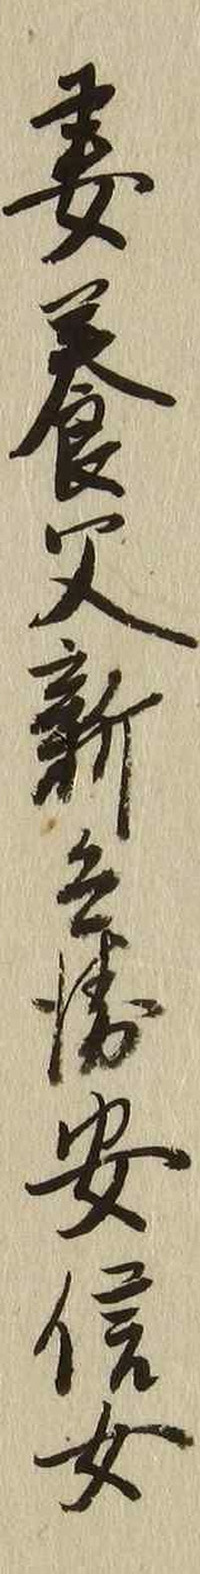妻養父新兵衛安信女
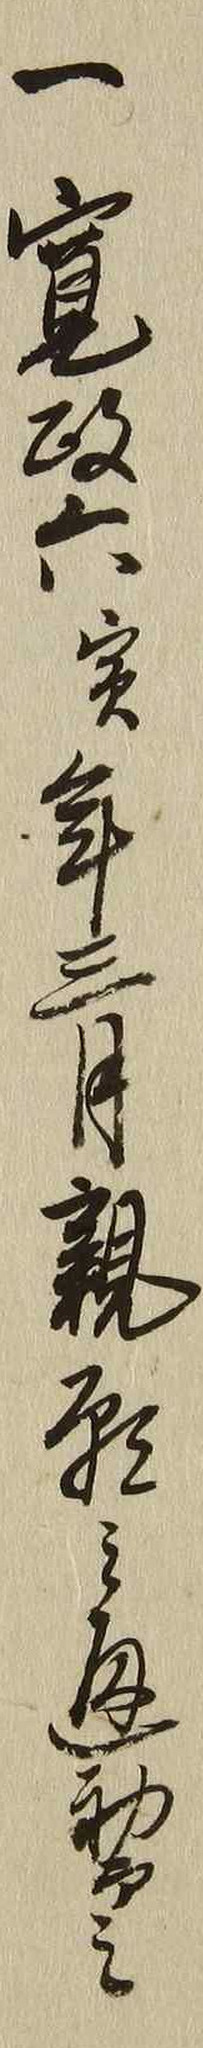一寛政六寅年三月親願之通初而之
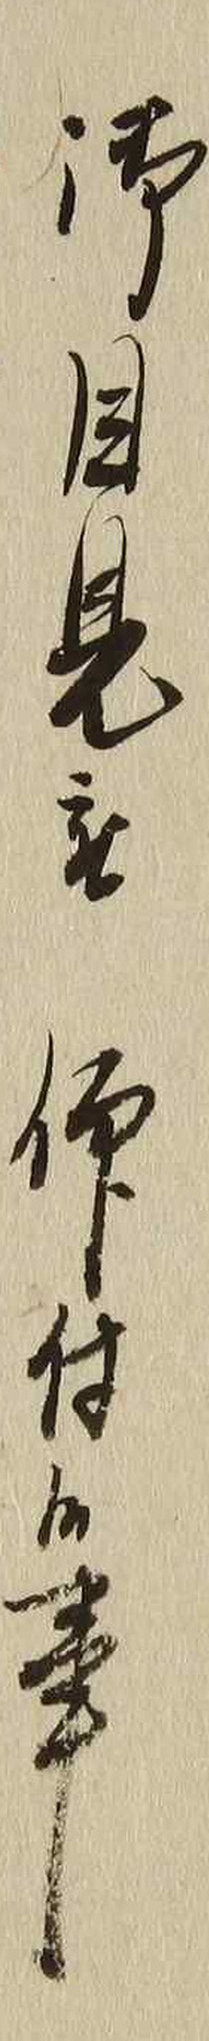御目見被仰付候事
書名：諸士系譜　巻之348　も之部4
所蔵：会津若松市立会津図書館
